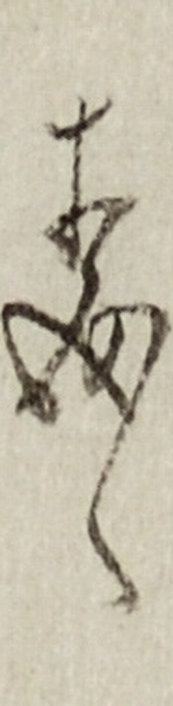相成候
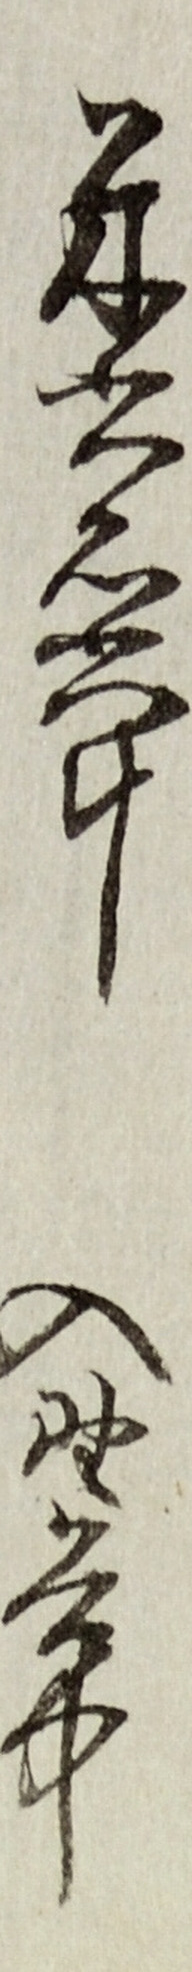米六石六斗入野谷中
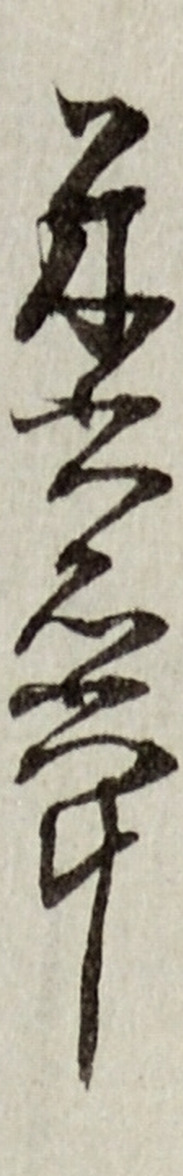米六石六斗
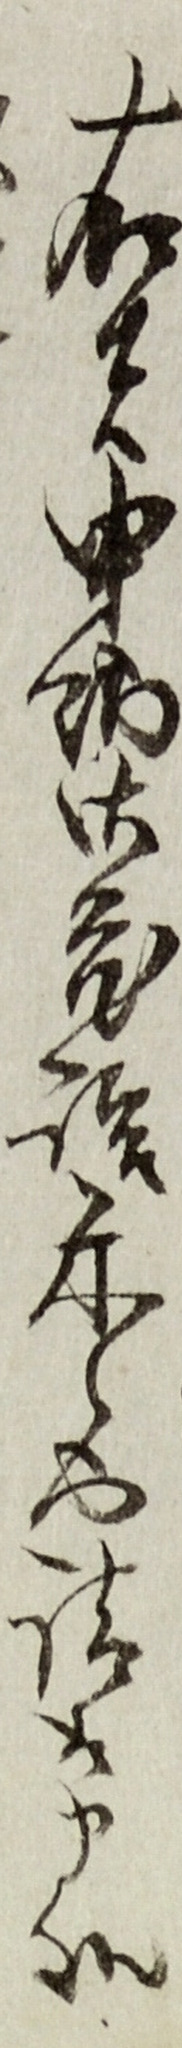右者申納御蔵給米之内請取申処
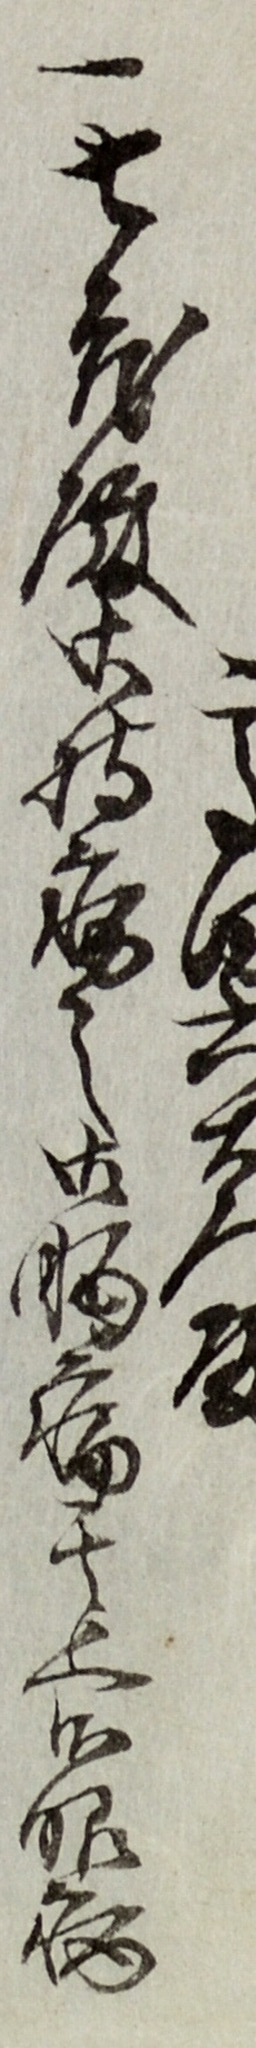一七蔵殿御持病之御胸痛其上御眼病
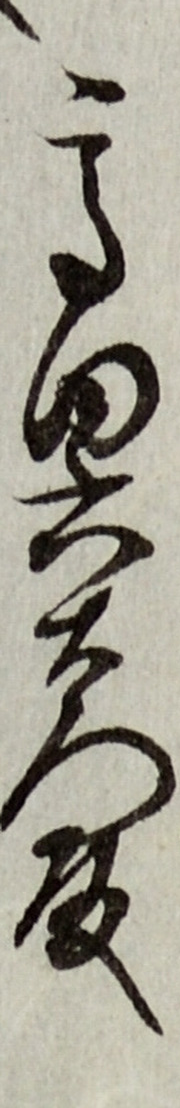高田六右衛門殿

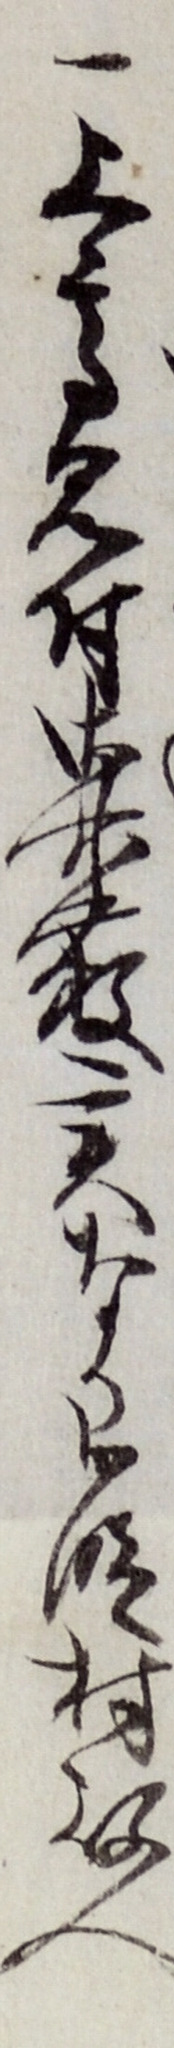一上高見村御竹薮実なり候段村役人
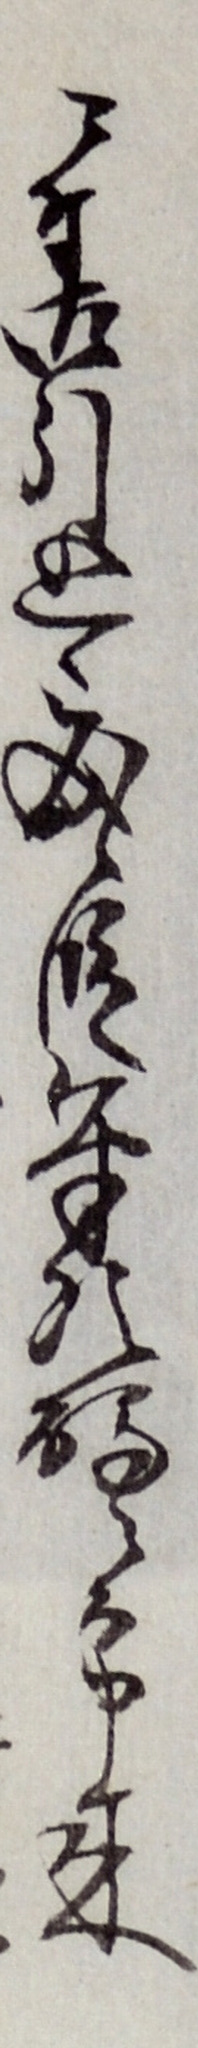ニ付御引込被成候段筆頭触ニ而申来
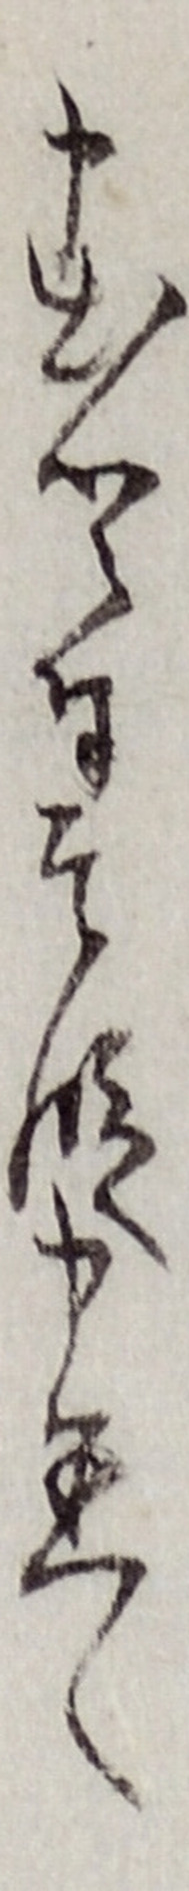申出候ニ付其段申達候

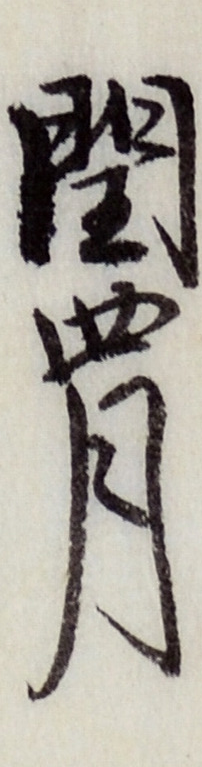閏四月
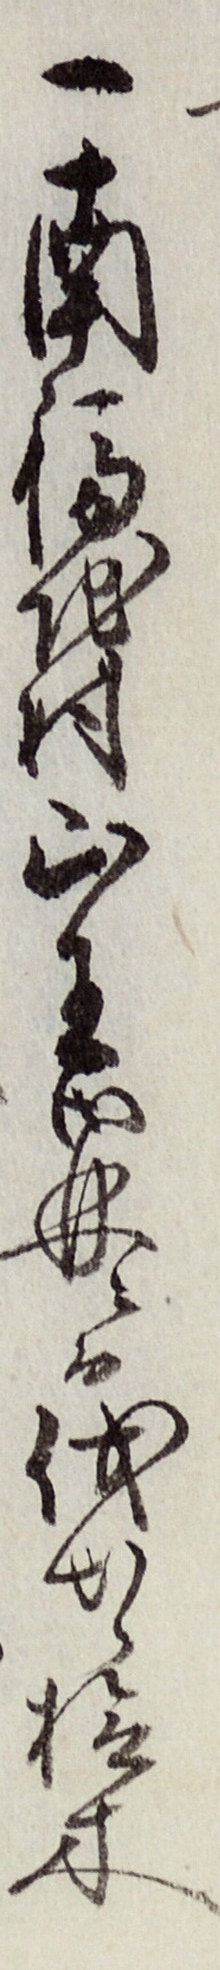一南福地村山王御林ニ而伐出候桧木
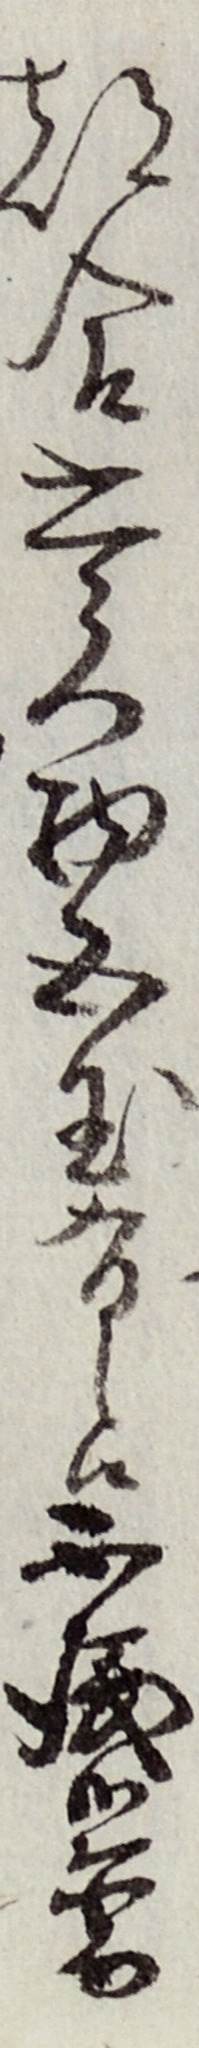都合六尺物五玉有之候不残御普
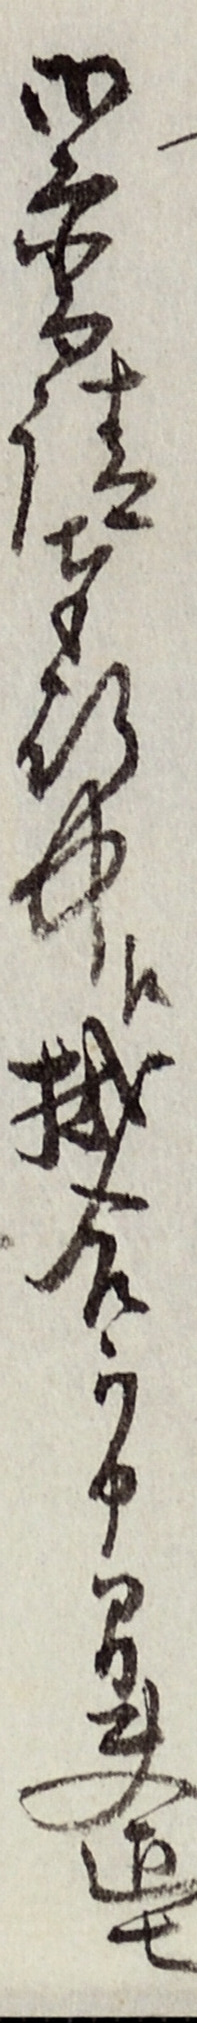御普請奉行中江掛合可申間夫迄
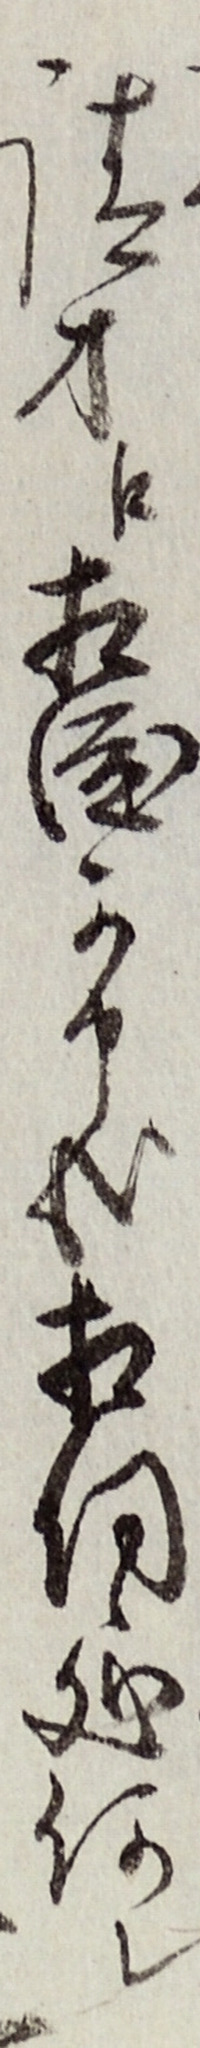請方江相渡可申哉相伺候処何レ
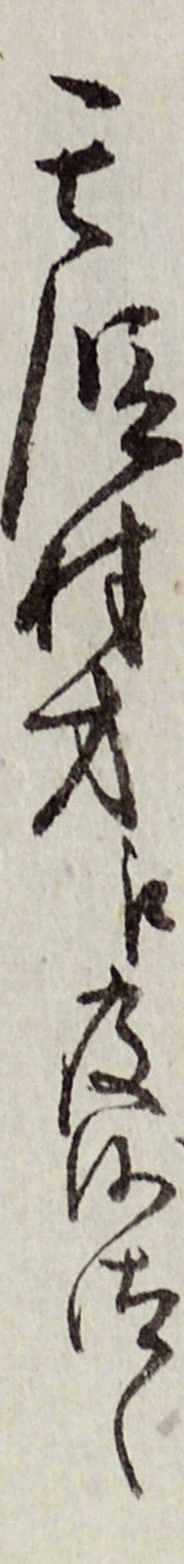其段村方江及沙汰候
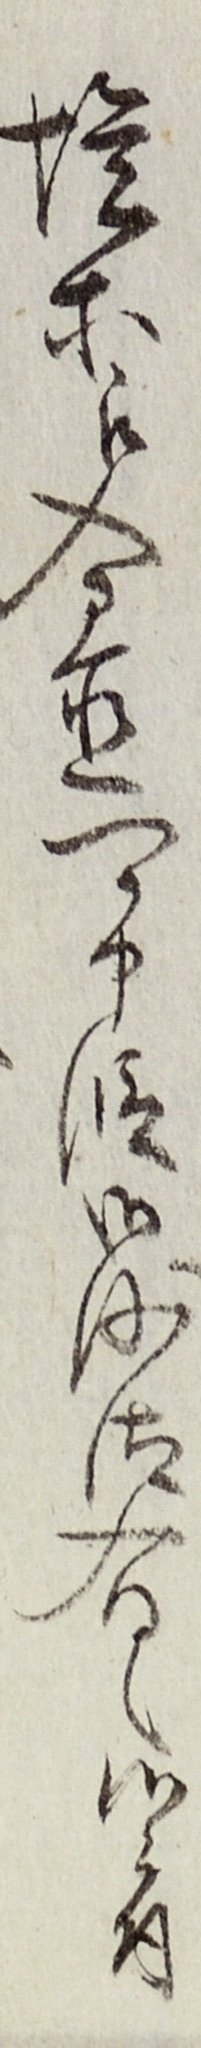等江入置可申段御沙汰有之候ニ付
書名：御山方御薪方諸事御用留
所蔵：伊那市立高遠町図書館・合同会社AMANE
